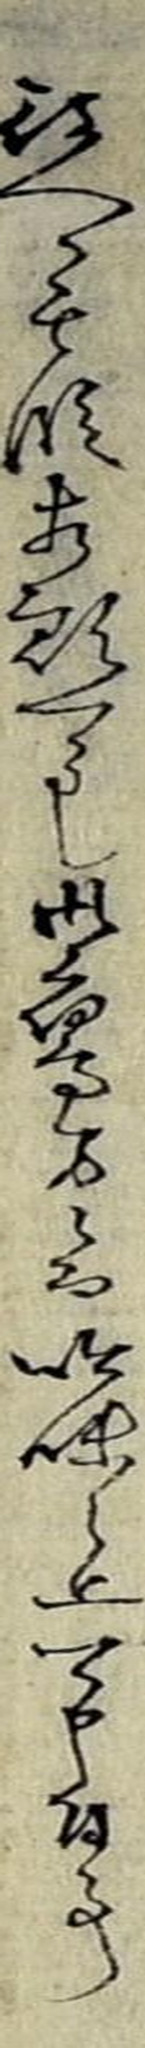役人へ其段相願可申候御鷹方ニ而吟味之上可申付事
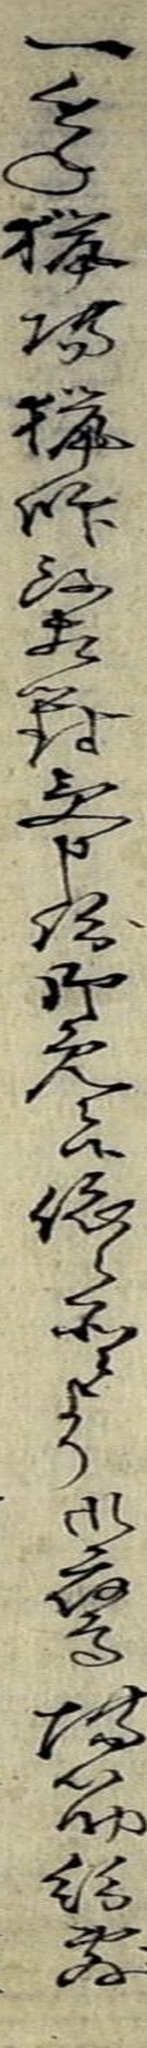一近年猟場猟師致相対受申儀御免ニ候依之所ニより御鷹場筋紛敷
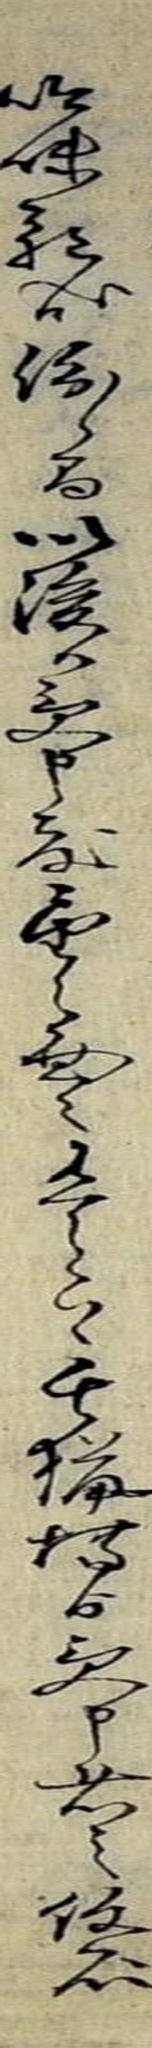吟味難成儀候間以後ハ受申度望之面々有之候ハヽ其猟場ゟ受申者之仮名
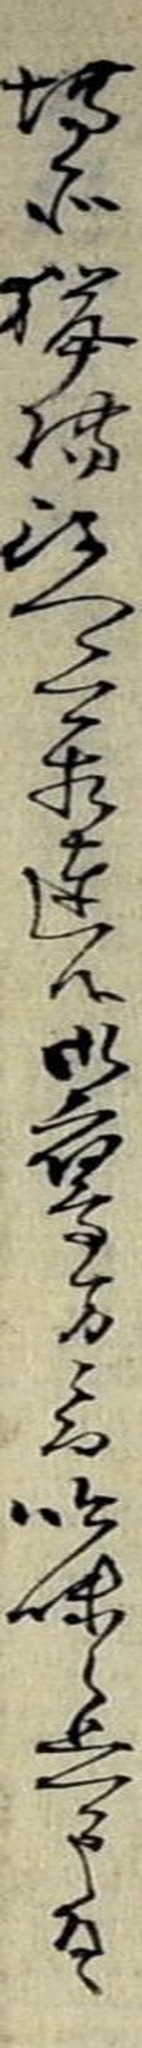場所猟場役人へ可相達候御鷹方ニ而吟味之上可申付候
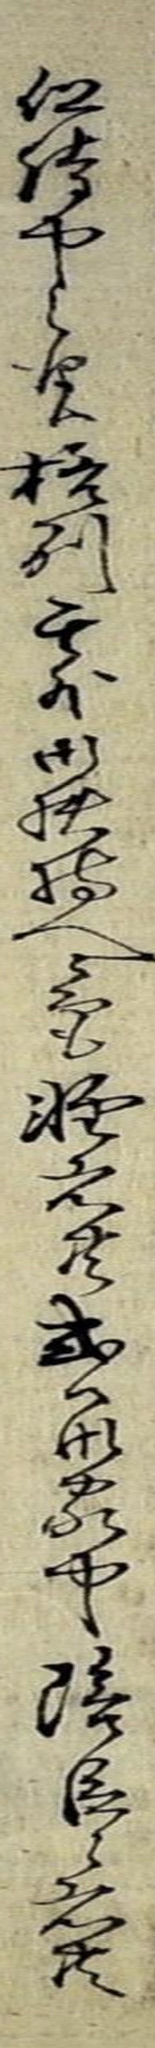但侍中之儀ハ格別其外御扶持人ニ而も軽者共或ハ御家中陪臣之者共
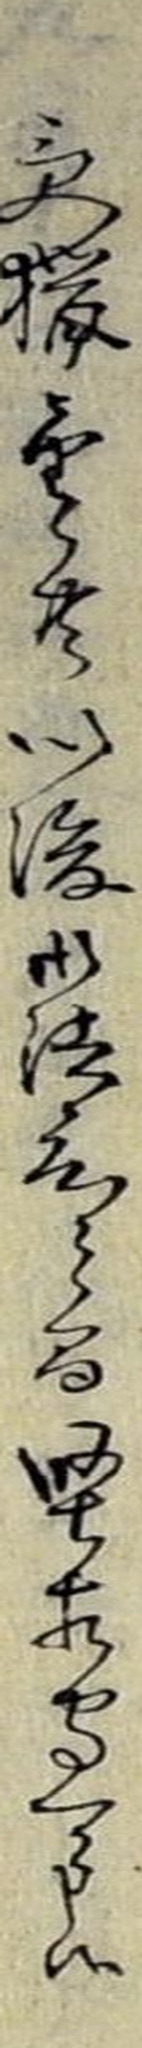受猟望候共以後御法度ニ候間堅相守可申候
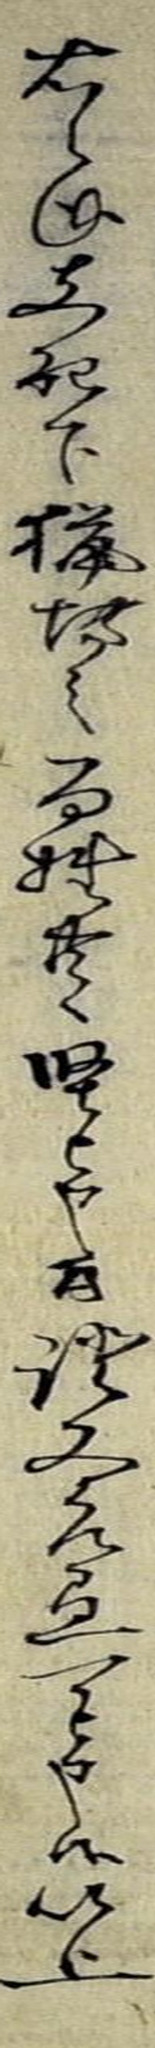右之趣支配下猟場之百姓共へ堅被申付証文取置可被申候以上
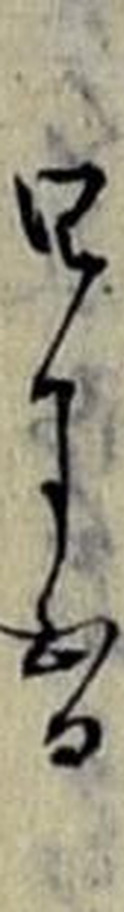四月五日
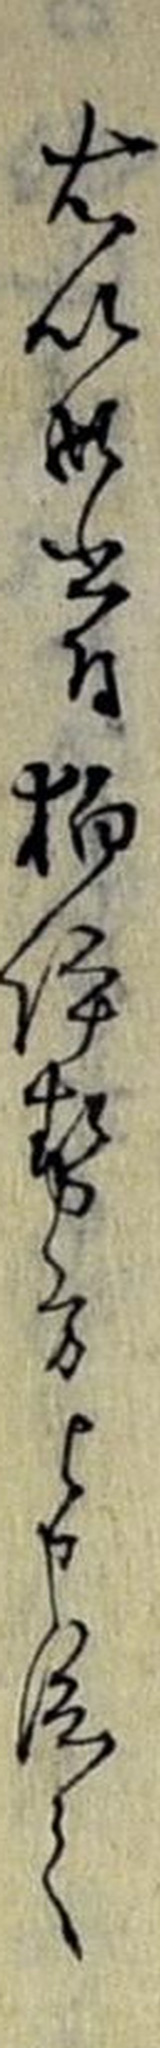右以御書付狛伊勢方被申渡之
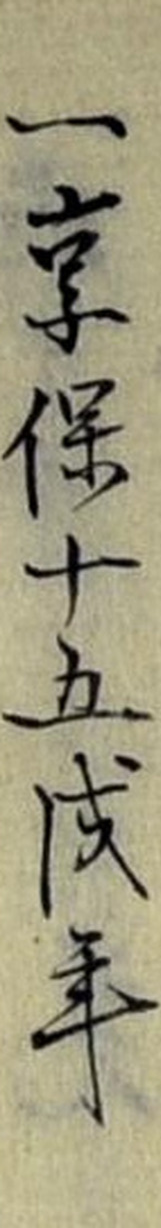一享保十五戌年
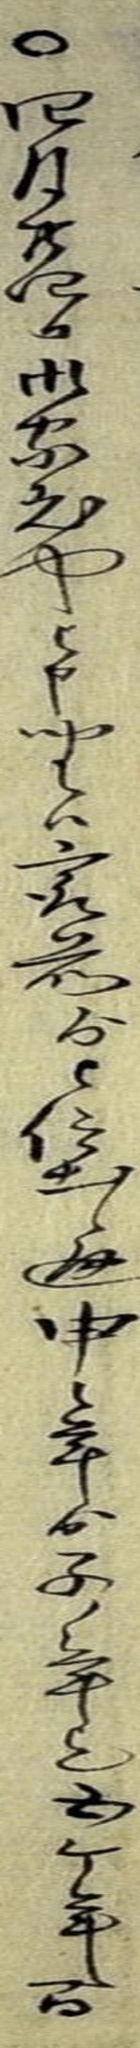〇四月廿四日御家老中被申聞候ハ最前ゟ被仰出候通申之年ゟ子ノ年迄五ケ年間
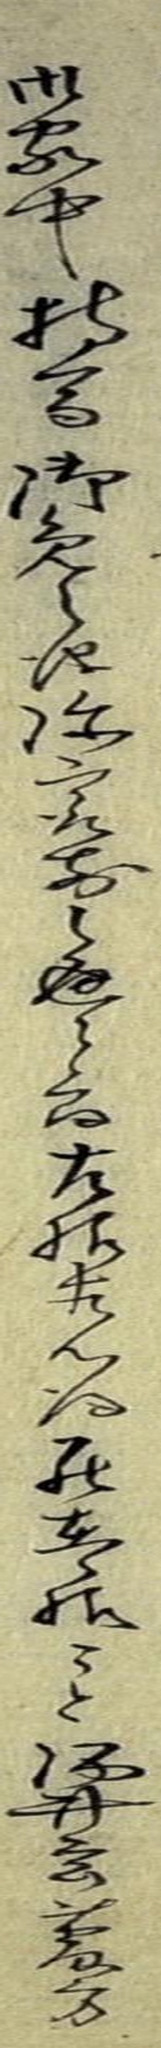御家中持馬御免之儀弥最前之通ニ候間左様相心得罷在候様ニと酒井玄蕃方
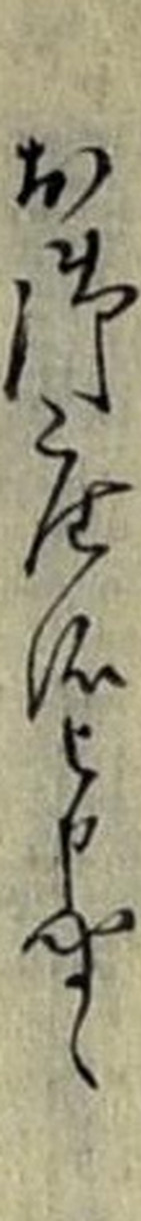於御座所被申聞候
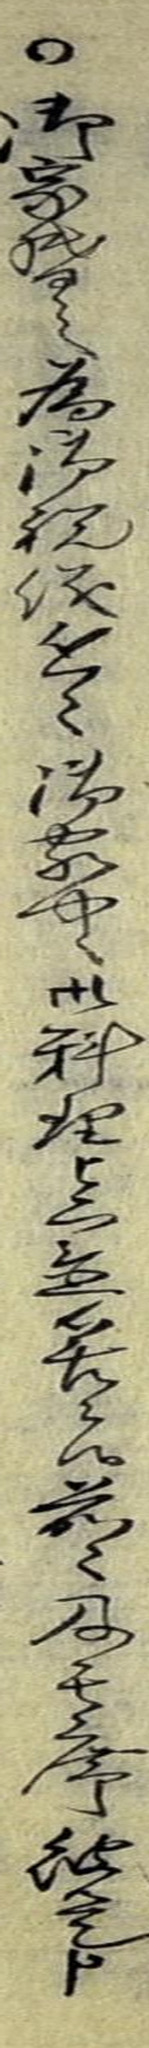〇御家督之為御祝儀近々御家中へ御料理被下置筈ニ候前々及其席彼是申
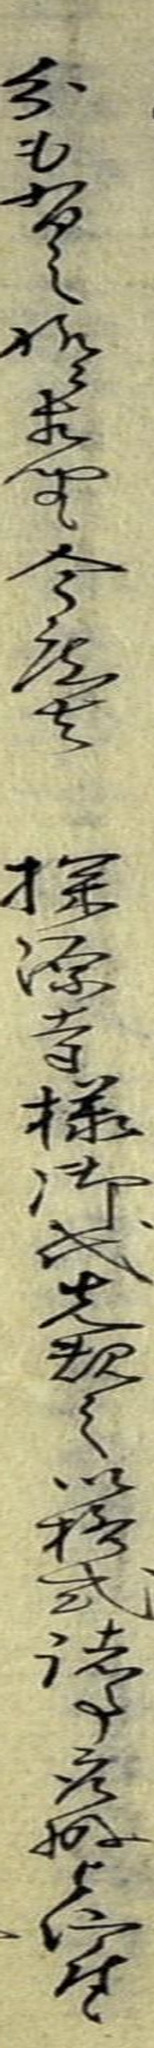分も有之様ニ相聞候今度者探源寺様御代先規之以格式諸事取扱被仰付候
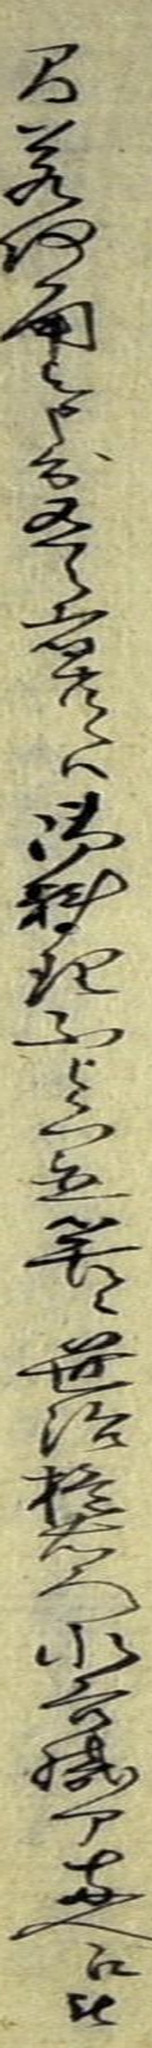間若何角与申分有之者共ヘハ御料理不被下置筈ニ笹治権右衛門水谷織部両人江被
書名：命令之部 一
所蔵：福井県文書館 Fukui Prefectural Archives
